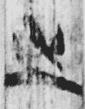之
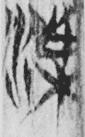○（阻）
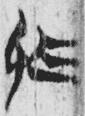於
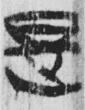是
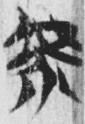{虍介}（乎）
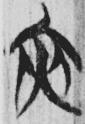夾
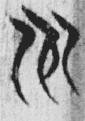州
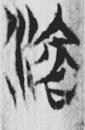○（徐）
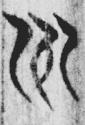州
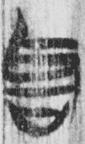○（始）
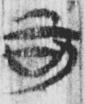可
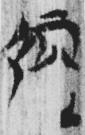凥（處）
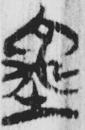○（禹）
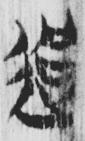迵（通）
